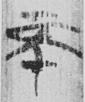不
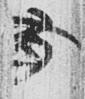有
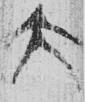大
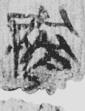○（禍）
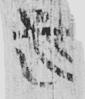必
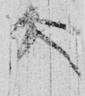大
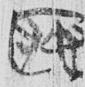恥
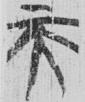天
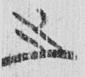之
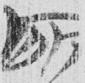所
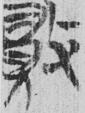敗
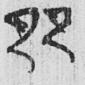○（選）
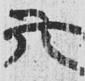亓
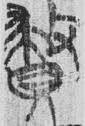○（賕）
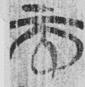而
